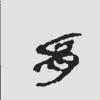日月
